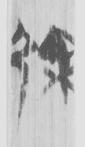{弓？木}
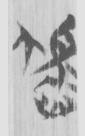{虫舀}
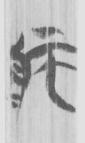痋
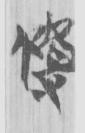{虫虍且又}
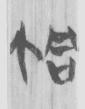蜩
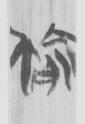蝓
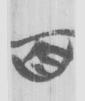百
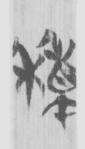種
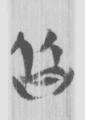皆
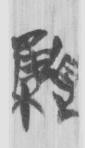{集頁}
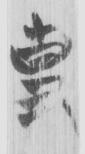吏
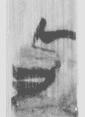此
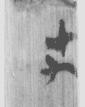{十九}
